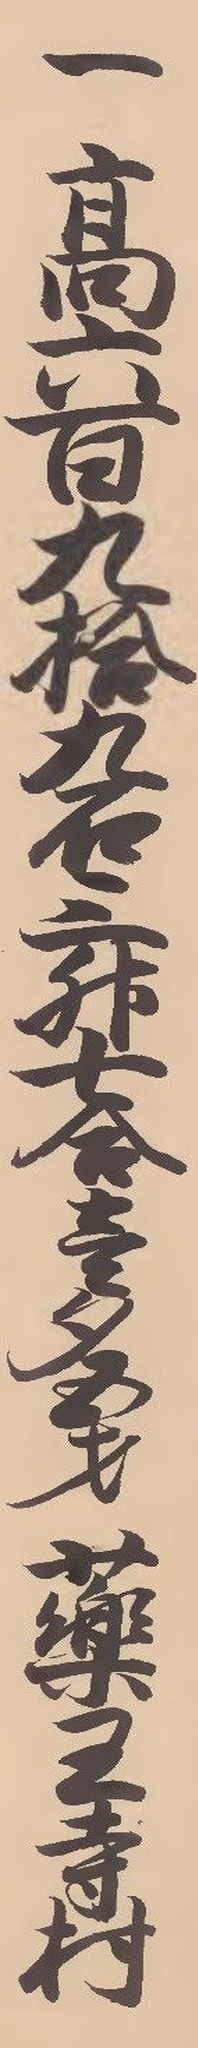一高六百九拾九石三升七合壱勺五才薬王寺村
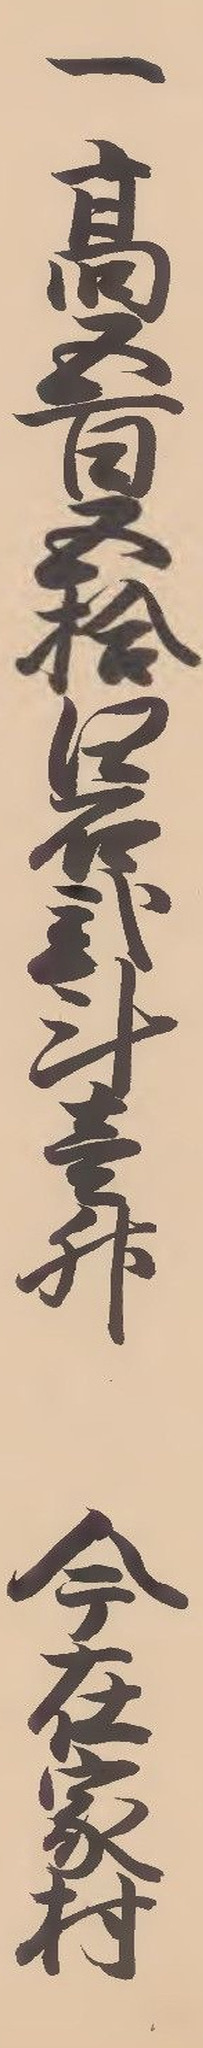一高五百五拾四石弐斗壱升今在家村
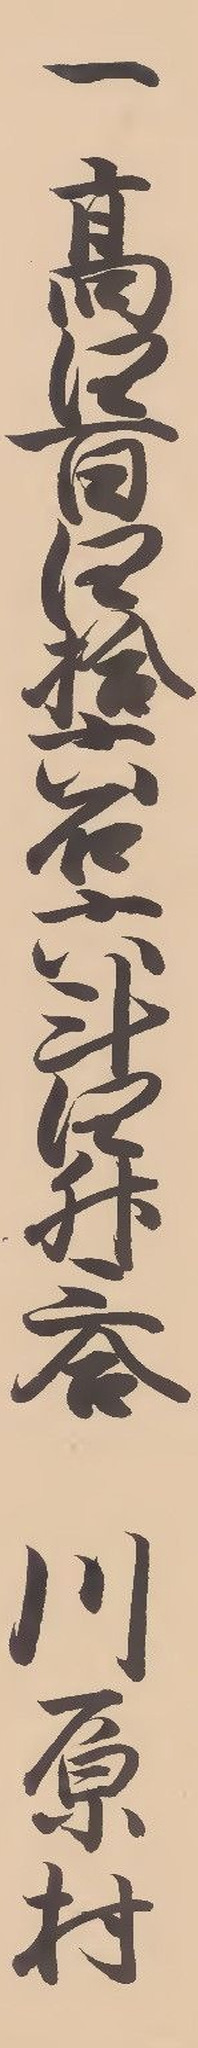一高四百四拾六石六斗四升三合川原村
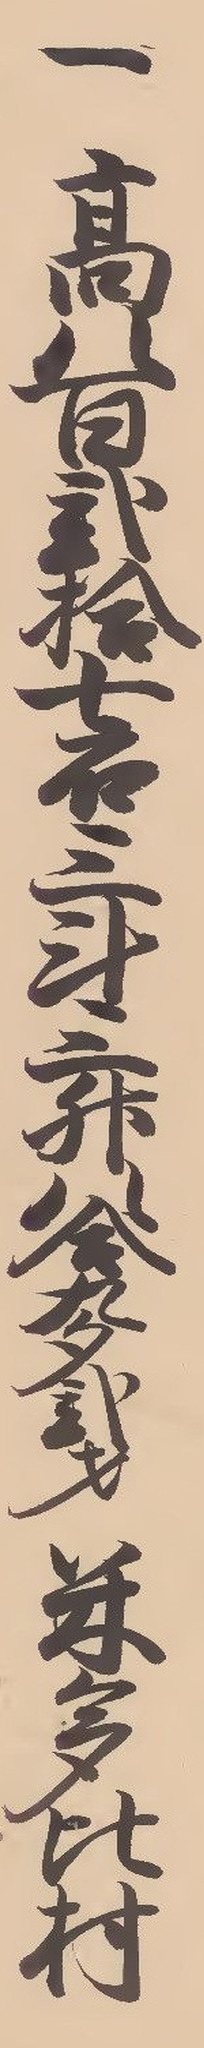一高八百弐拾七石三斗三升八合九勺弐才米多比村

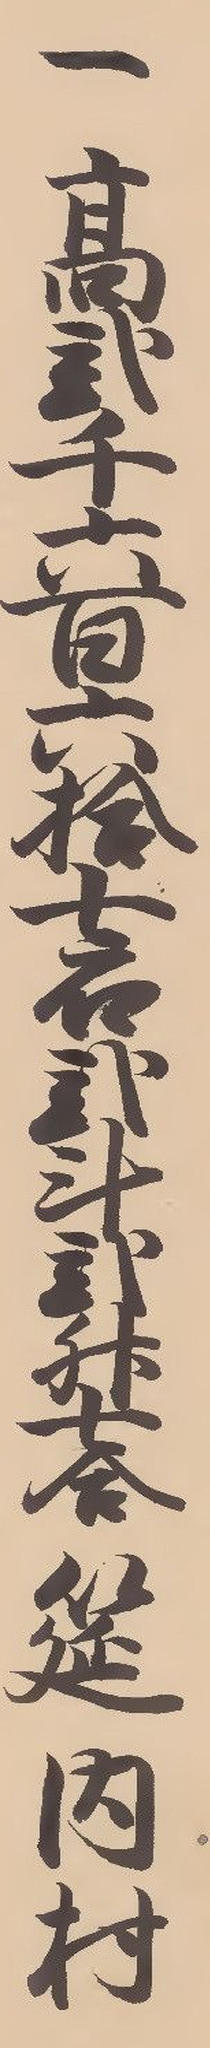一高弐千六百六拾七右弐斗弐升七合筵内村
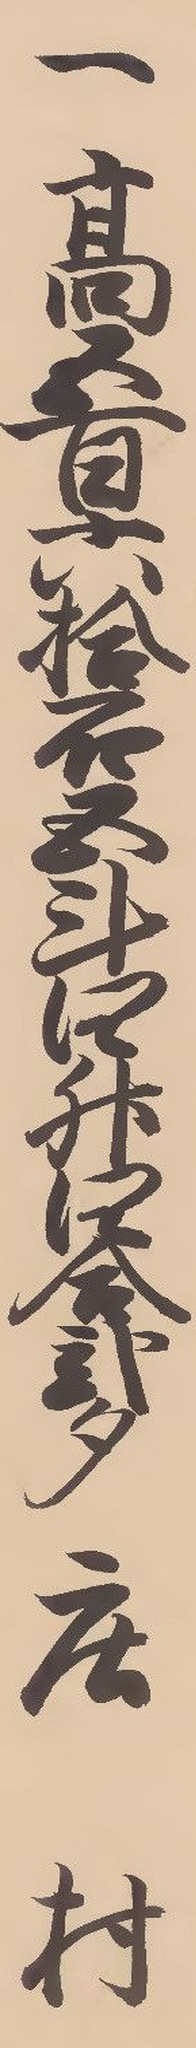一高五百六拾石五斗四升四合弐勺庄村
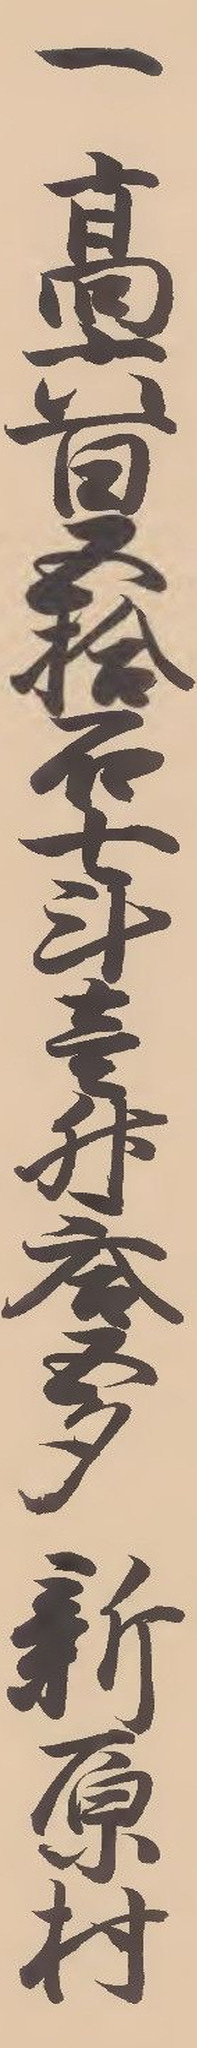一高六百五拾石七斗壱升三合五勺新原村
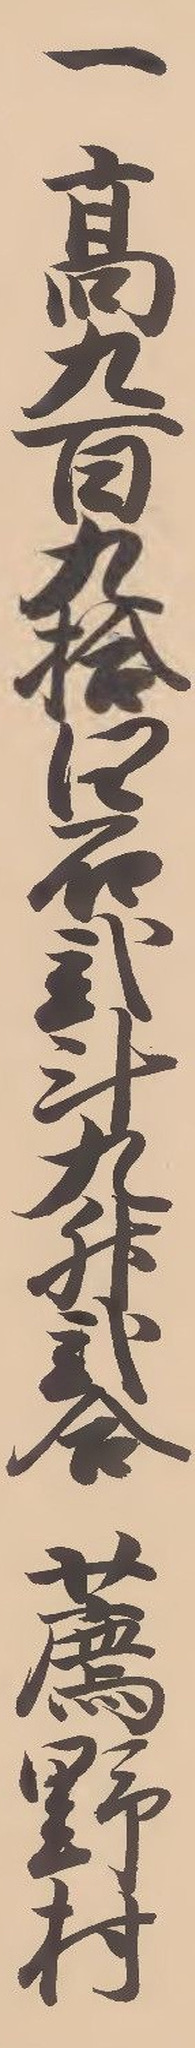一高九百九拾四石弐斗九升弐合薦野村
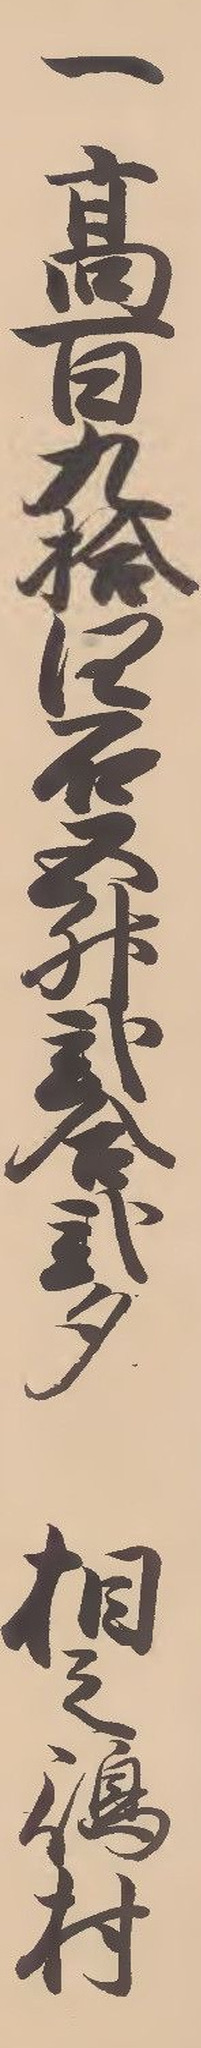一高百九拾四石五升弐合弐勺相之島村
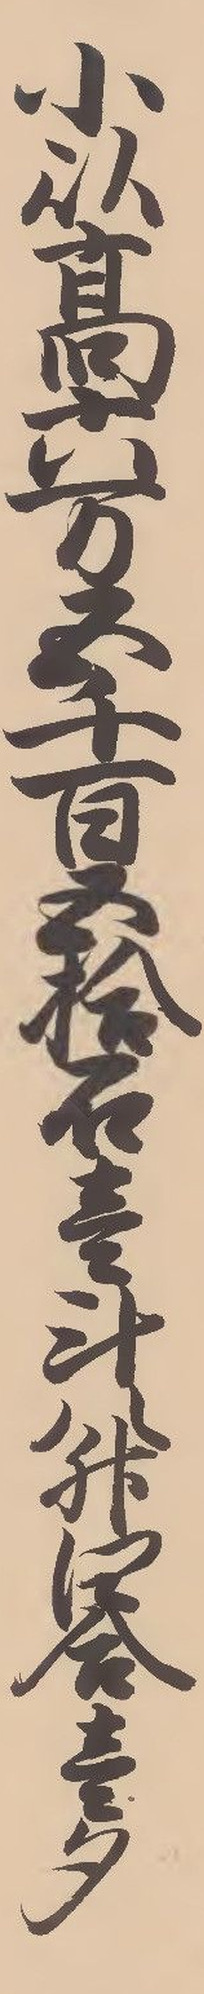小以高六万五千百五拾石壱斗八升四合壱勺

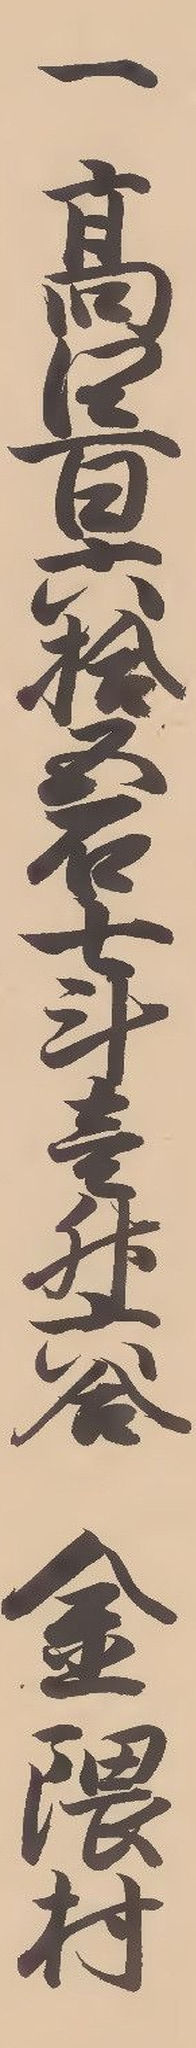一高四百六拾五石七斗壱升六合金隈村
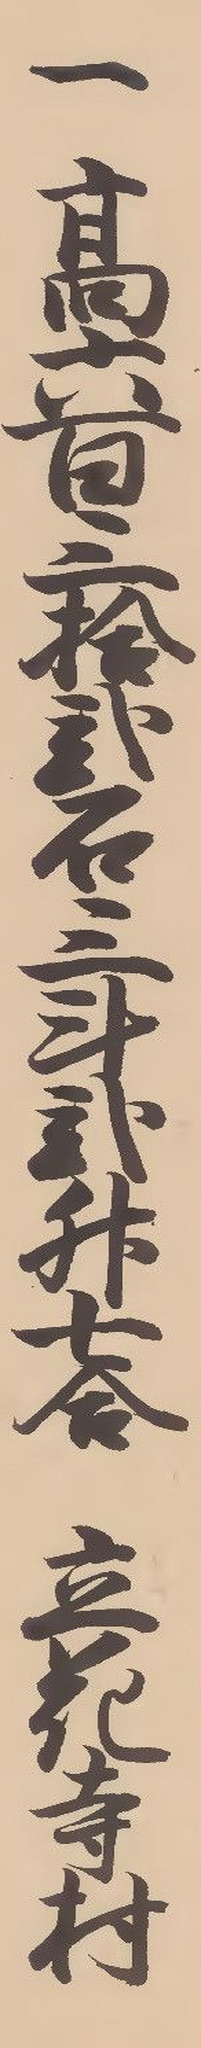一高六百三拾弐石三斗弐升七合立花寺村
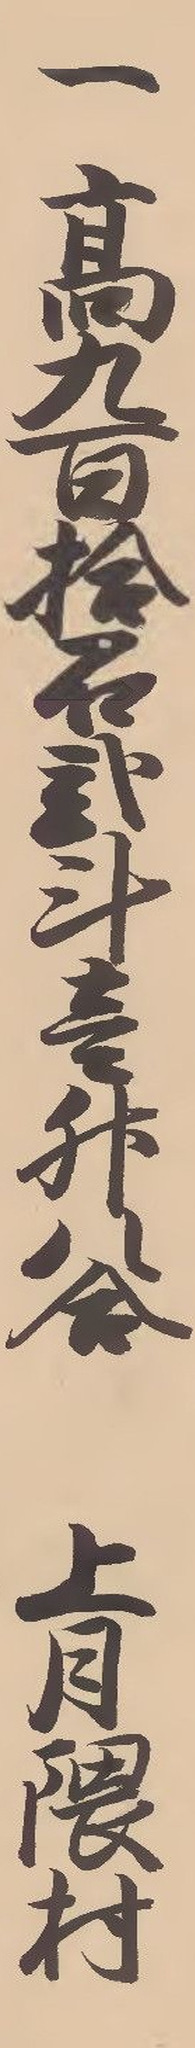一高九百拾石弐斗壱升八合上月隈村
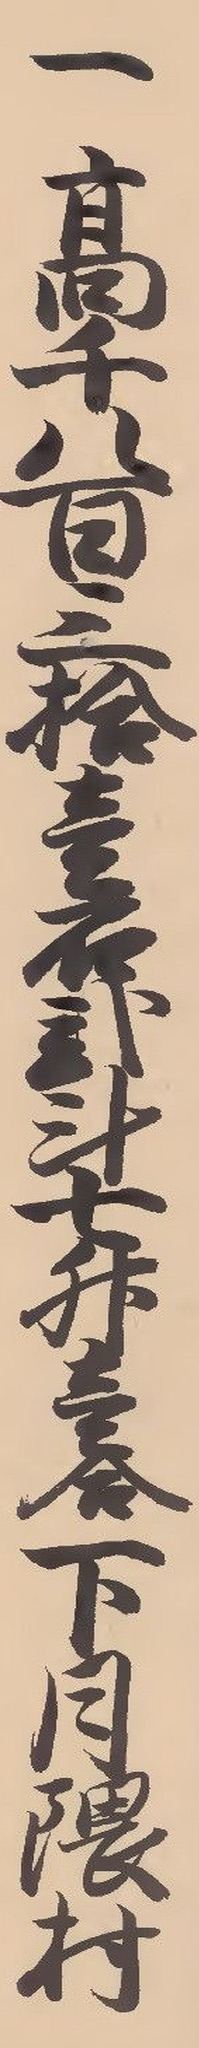一高千八百三拾壱石弐斗七升壱合下月隈村
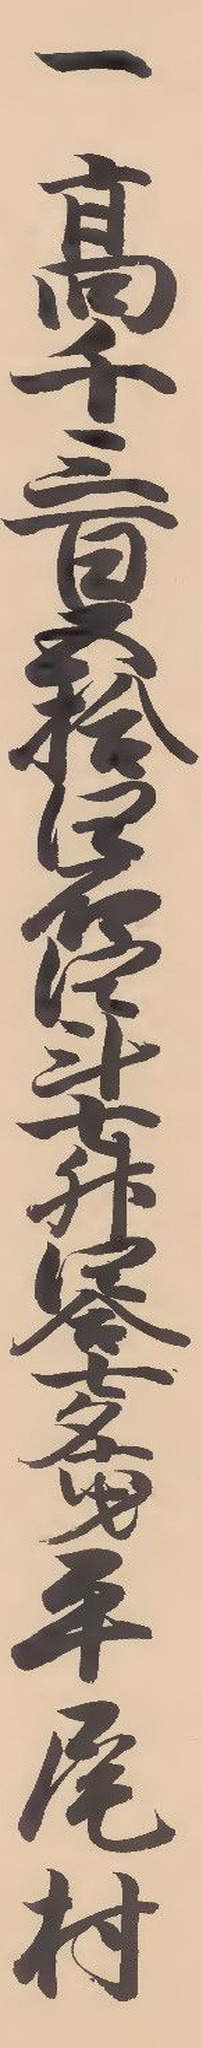一高千三百五拾四石四斗七升四合七勺六才平尾村

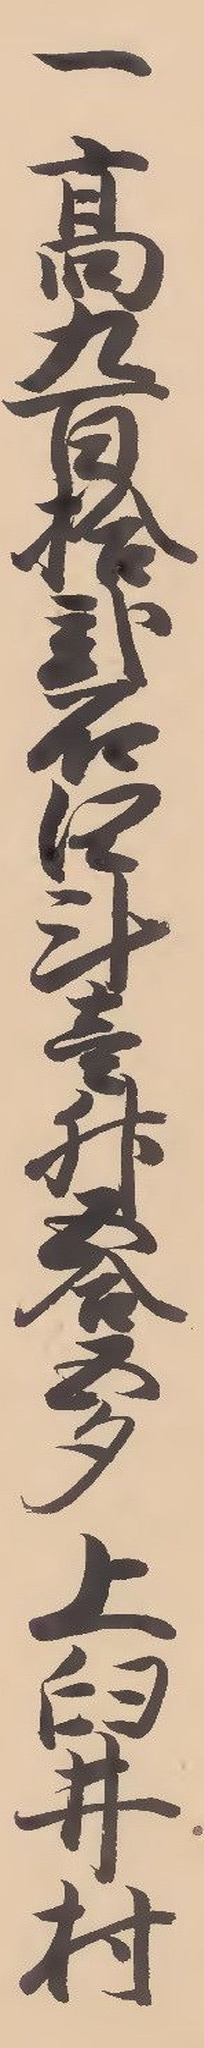一高九百拾弐石四斗壱升五合五勺上臼井村
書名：筑前国郷帳
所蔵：国立公文書館 National Archives of Japan
